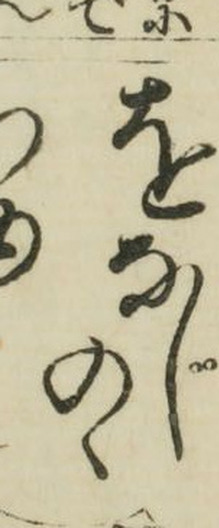をなじ
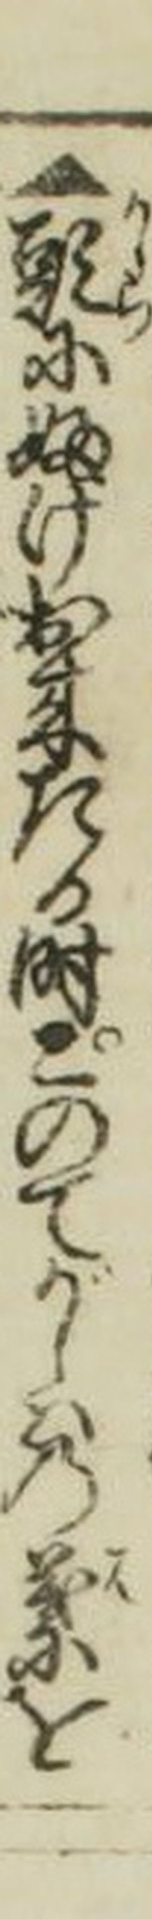▲頭にふけ出来たる時。このてがしはの葉を
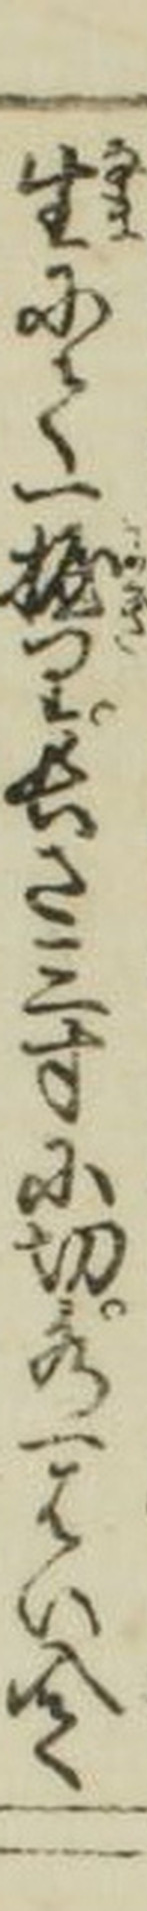生にて一握り。長さ三寸に切。水一はい入て
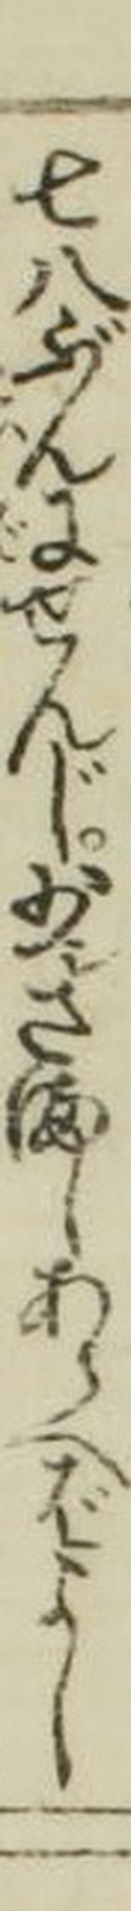七八ぶんにせんじ。少しさましあらへばよし
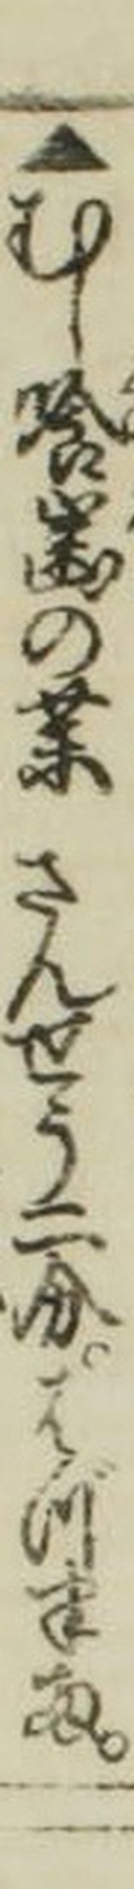▲むし喰歯の薬さんせう二分。はづ半両。
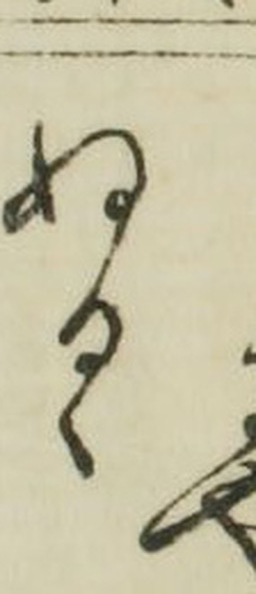ぬるゝ
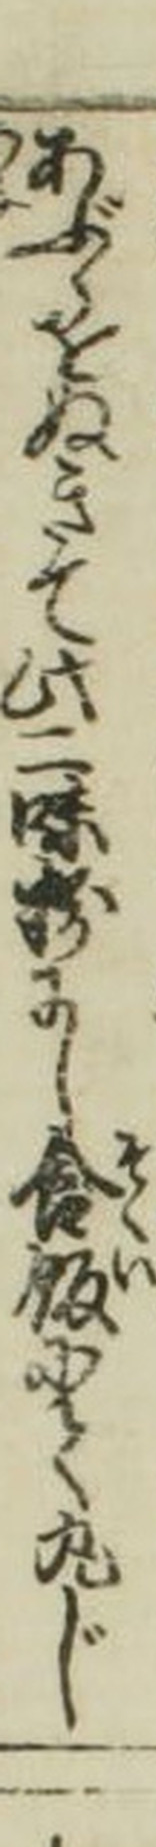あぶらをぬきて此二味粉にし食飯にて丸じ
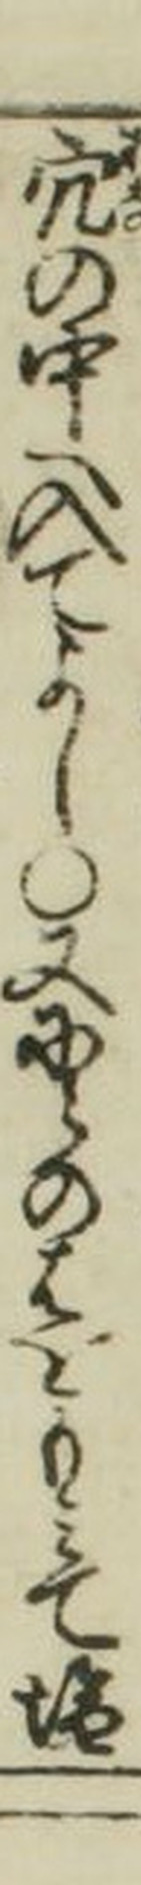穴の仲へ入てよし◯又にらのはをもみて塩
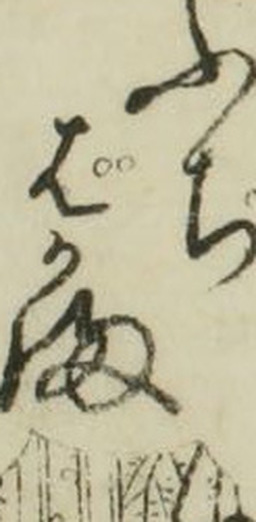ばかま
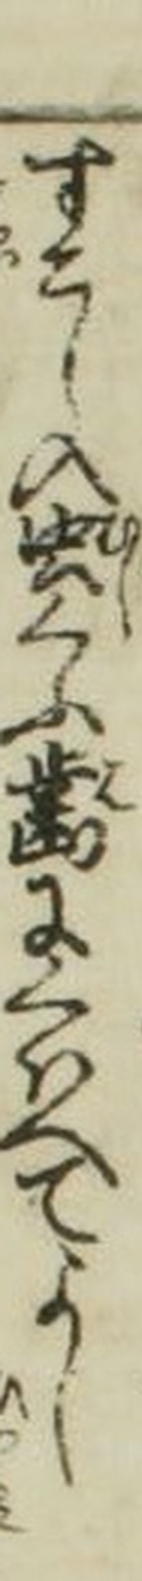すこし入虫くふ歯にくはへてよし
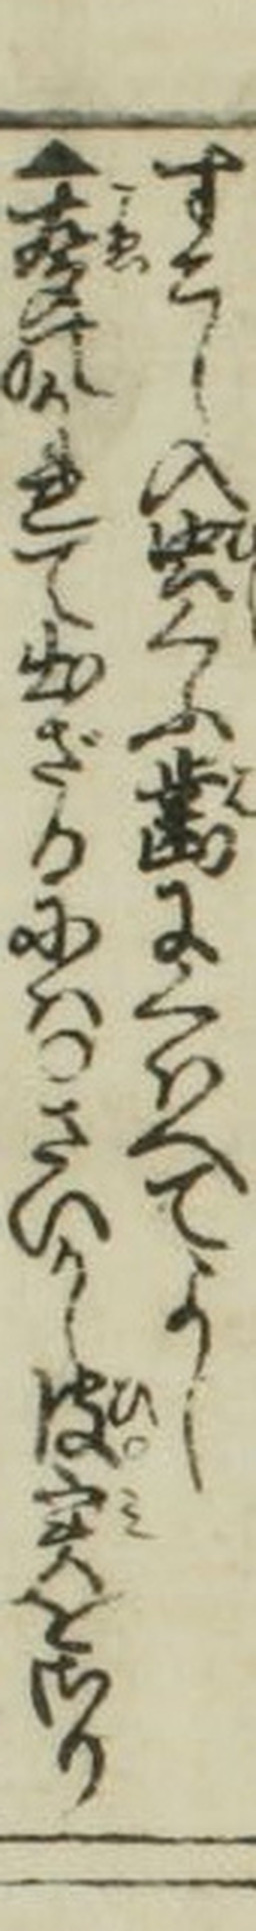▲声のかれて出ざるには◯さいかし皮。実をさり
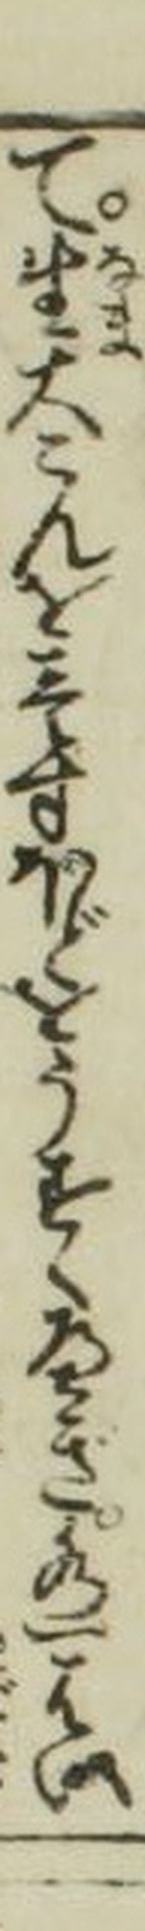て。生大こんを三寸ほどをうすくへぎ。水一はい
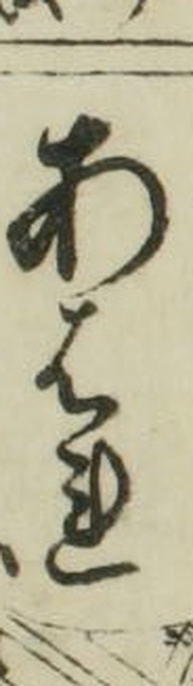あはれ
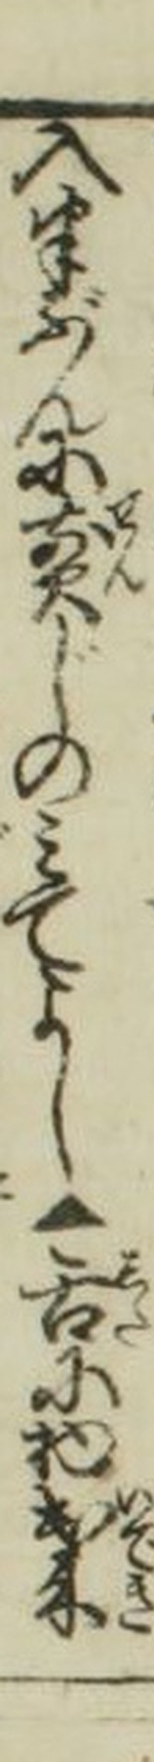入半ぶんに煎じのみてよし▲舌に物出来
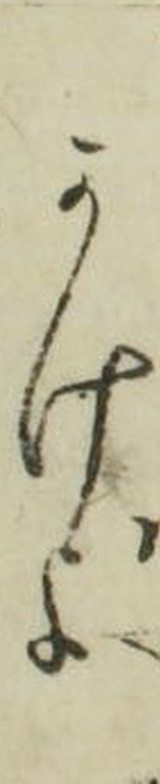かけよ
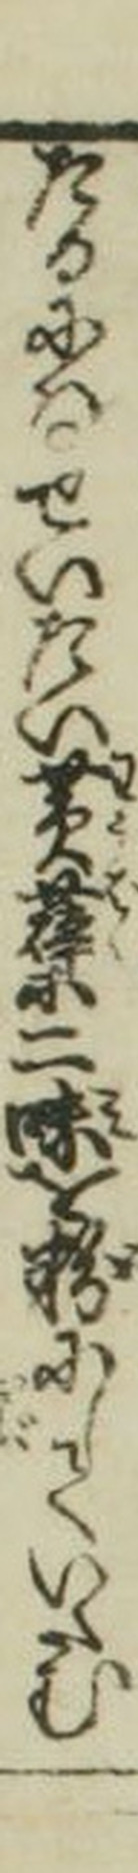たるには◯せいたい黄蘗二味を粉にしていたむ
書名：女源氏教訓鑑
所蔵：東京学芸大学附属図書館
